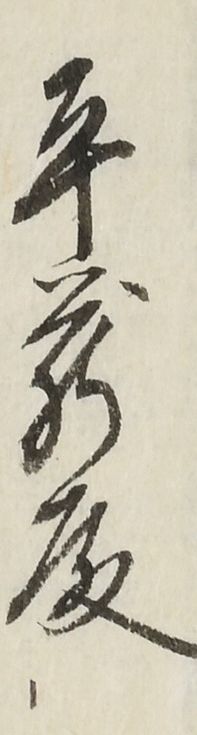平蔵殿
